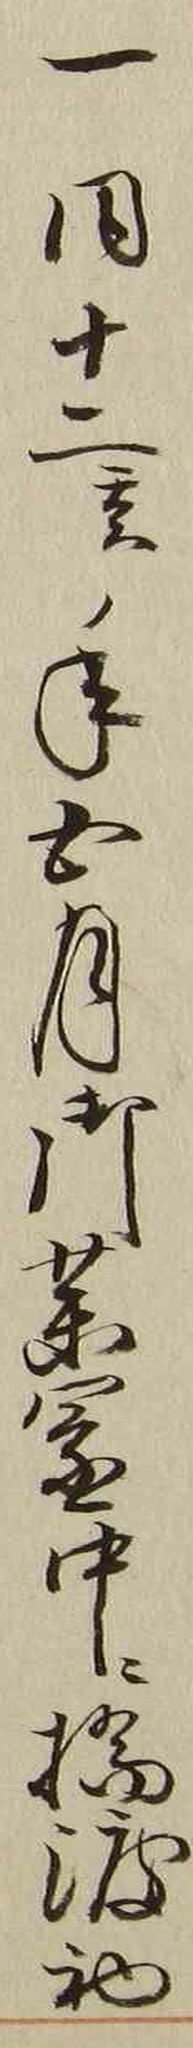一同十二亥年五月御薬園中ニ橋渡初
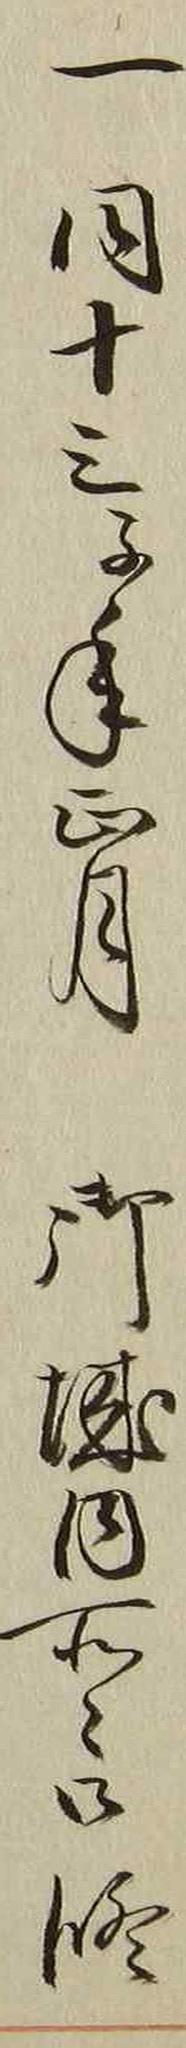一同十三子年正月御城内所々御修
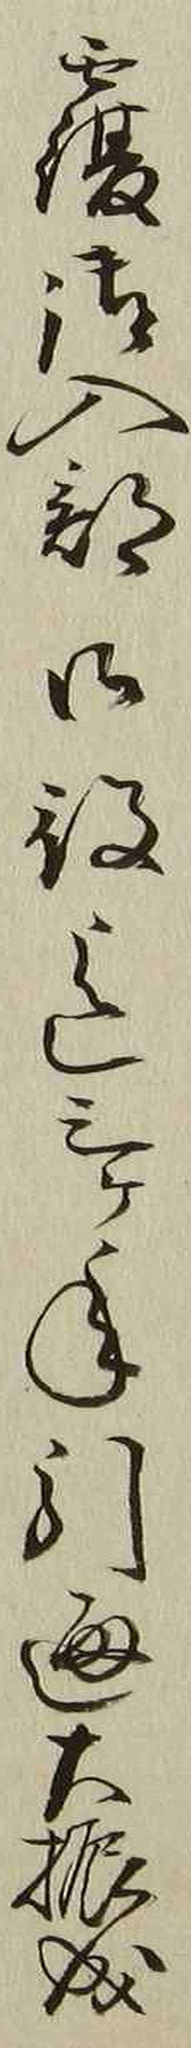覆御入部御役迄三ヶ年引通大振成
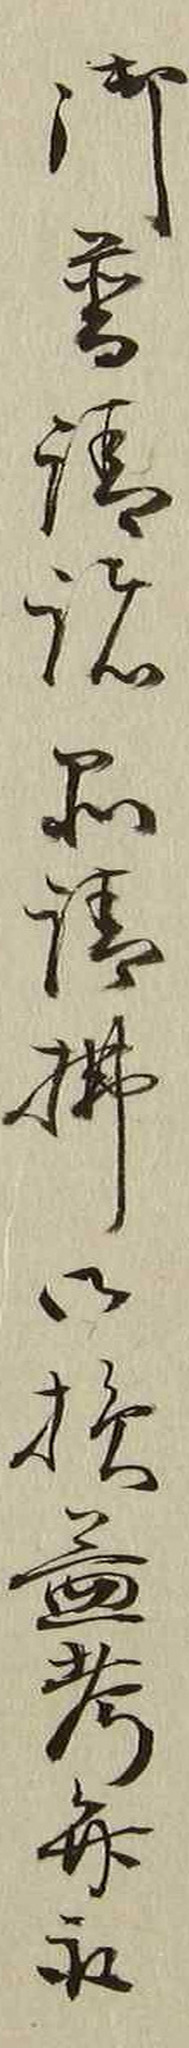御普請諸品請払御損益考弁取
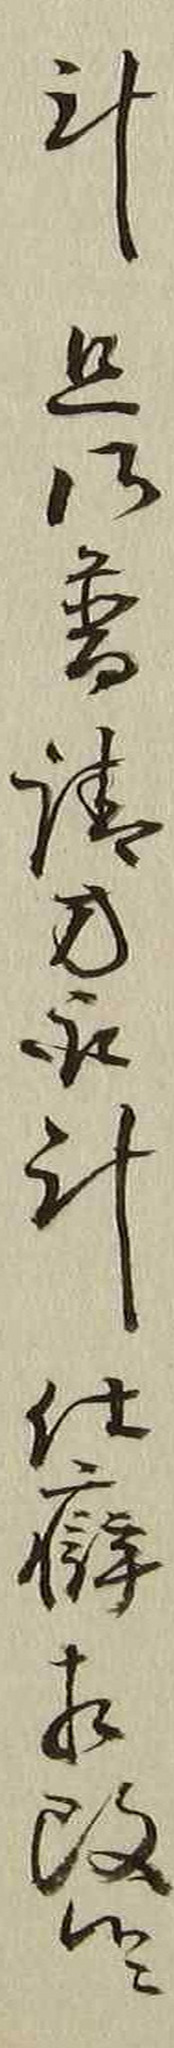計且御普請方取計仕癖相改候ニ
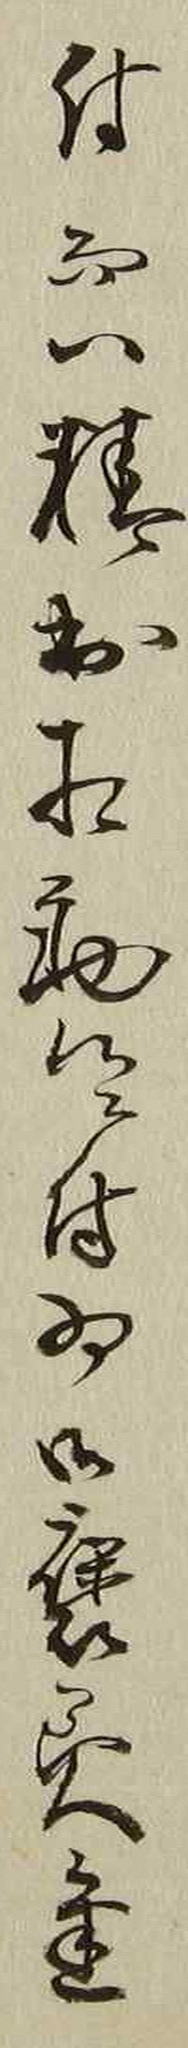付而ハ精出相勤候ニ付為御褒美金
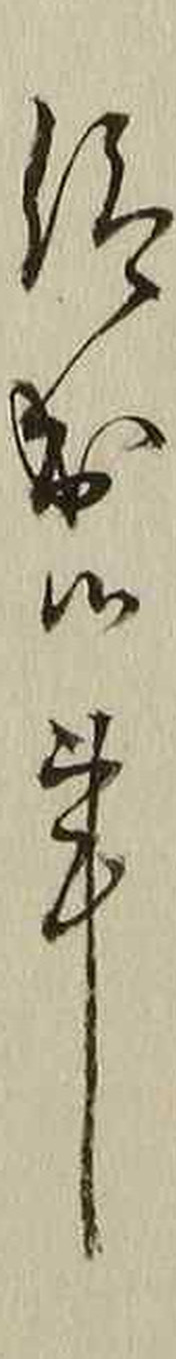仰出候事
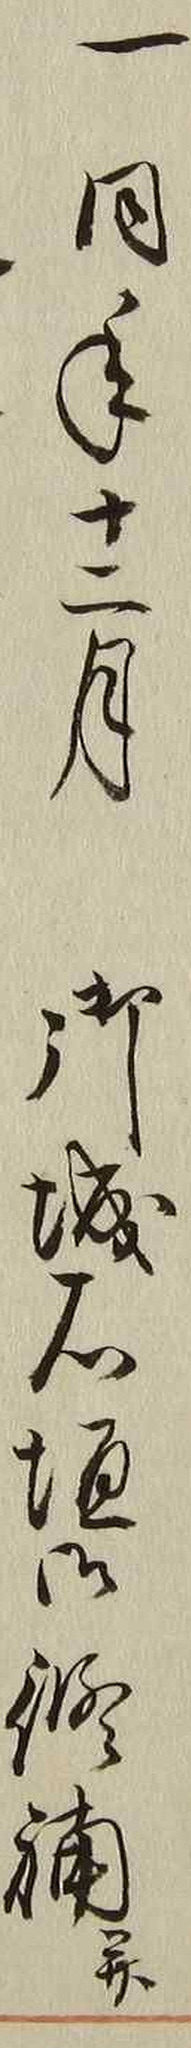一同年十二月御城石垣御修補并
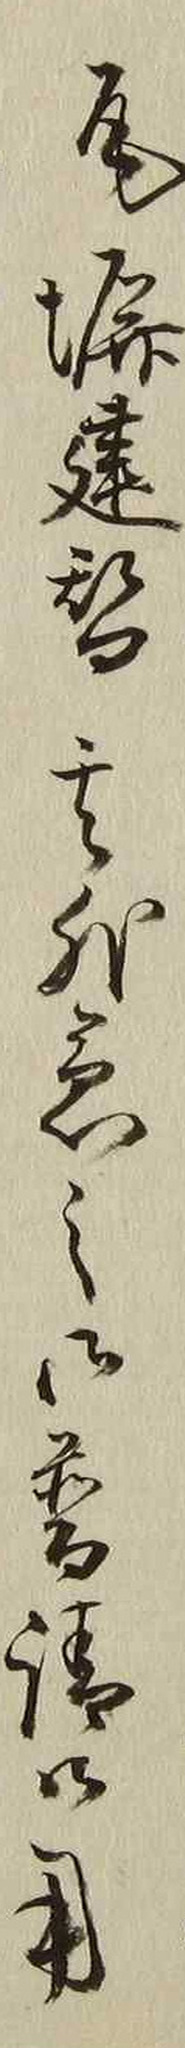瓦塀建替其外急之御普請御用
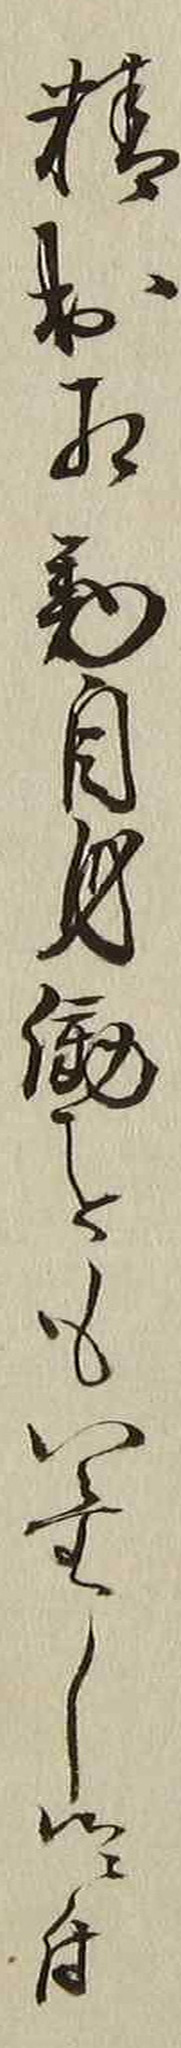精出相勤自身働をもいたし候ニ付
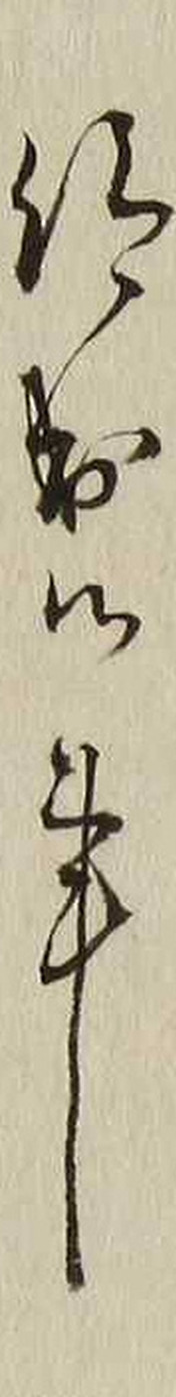仰出候事
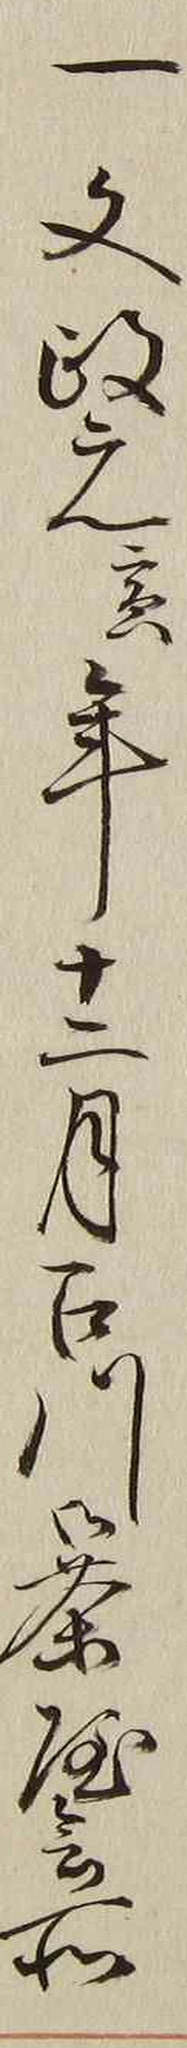一文政元寅年十二月古川御茶屋会所
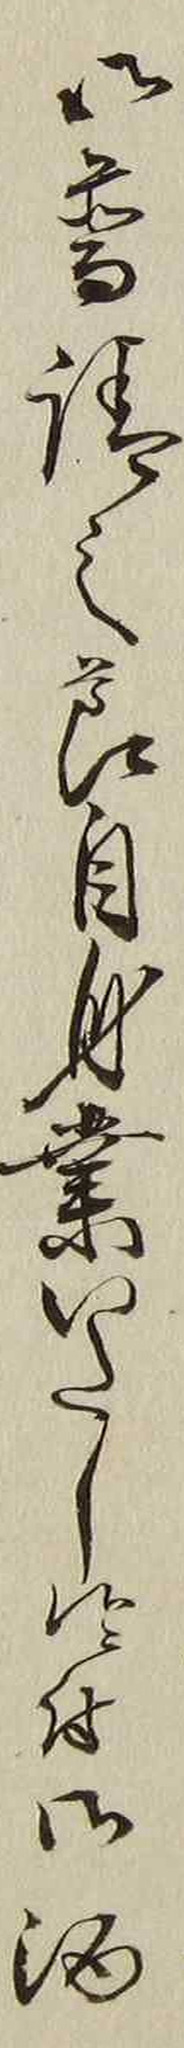御普請之節自身業いたし候ニ付御酒
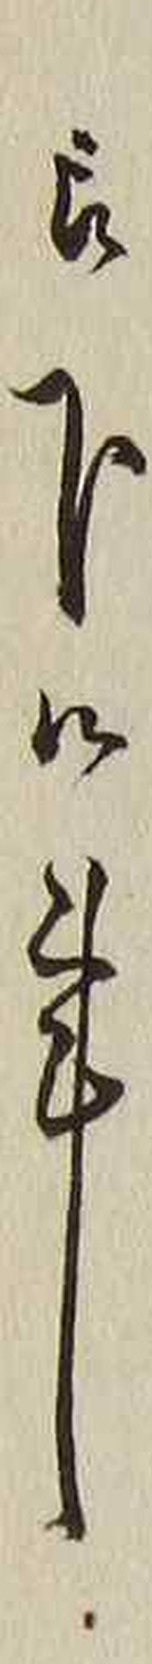被下候事
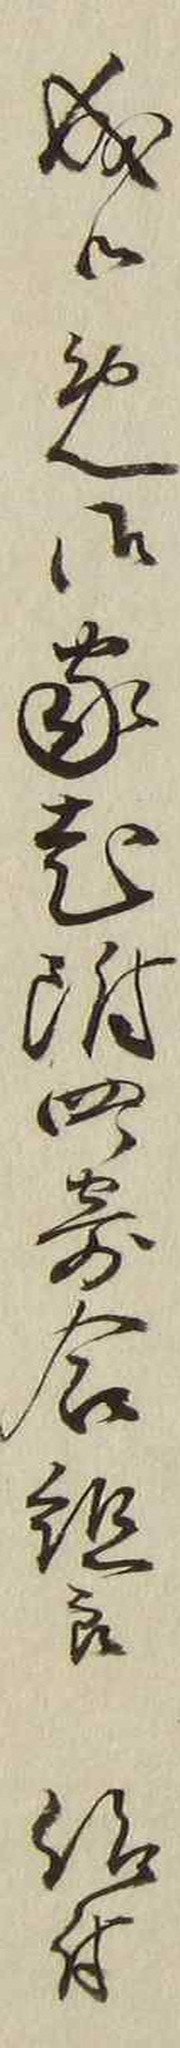成御免御家老附四ノ寄合組被仰付

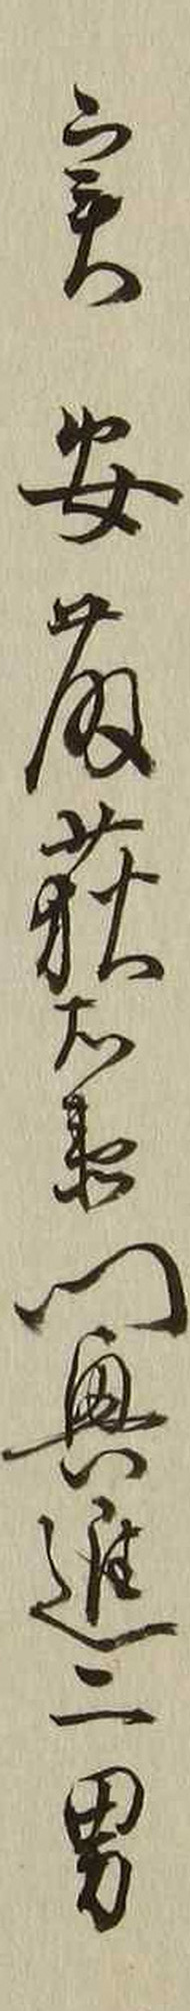実安藤萩右衛門興進二男
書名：諸士系譜　巻之57　ほ之部4
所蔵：会津若松市立会津図書館
